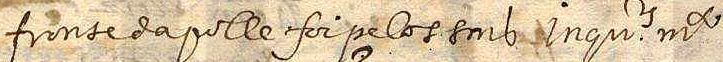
frente da polle foi pelos sors̄ inqu.rs mto
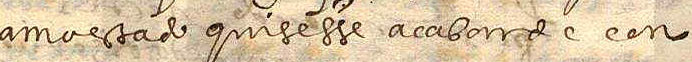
amoestado quisesse acabar de con
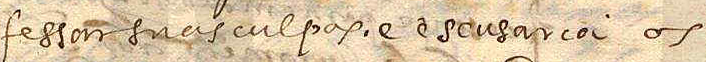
fessar suas culpas e escusaria os
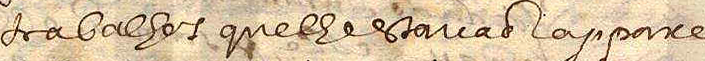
trabalhos que lhe estauaõ appare
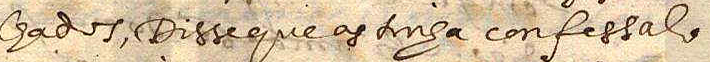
lhados, Disse que as tinha confessado
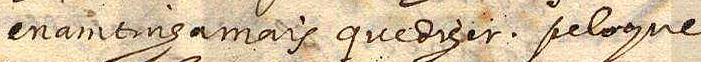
e nam tinha mais que dizer. pelo que
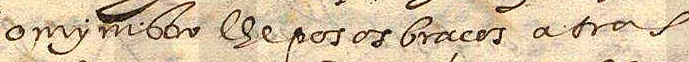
o mynistro lhe pos os braços atras
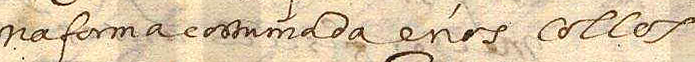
na forma costumada e nos collos
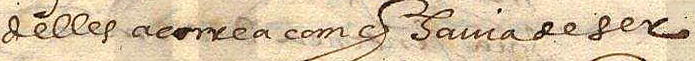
delles a correa com q̄ hauia de ser
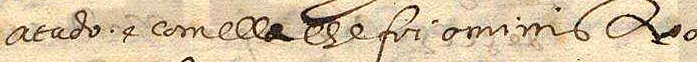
atado e com ella lhe foi o ministro
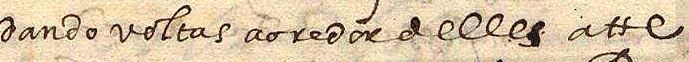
dando voltas ao redor delles atte
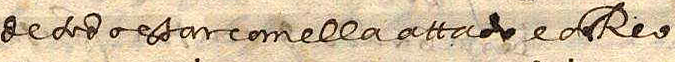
de todo estar com ella attado e o Reo
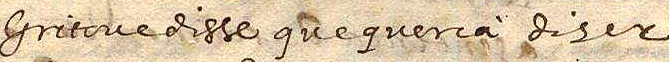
gritou e disse que queria dizer
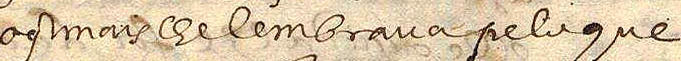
o q̄ mais lhe lembraua pelo que
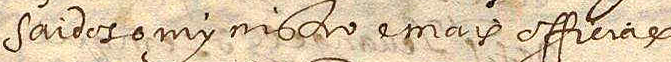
saidos o mynistro e mais officiaes
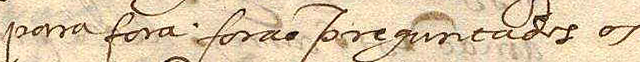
para fora foraō preguntados os
